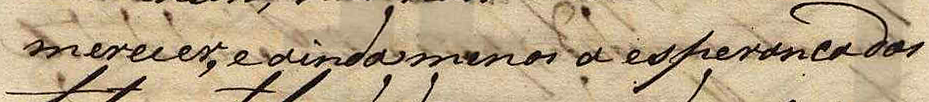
merecer, e ainda menos a esperança das
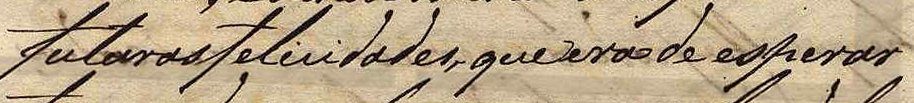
futuras felicidades, que era de esperar
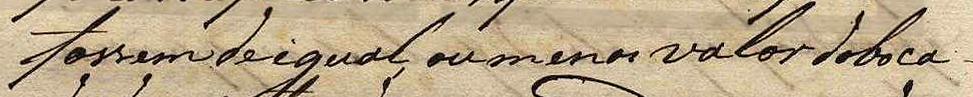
fossem de igual, ou menos valor do boca
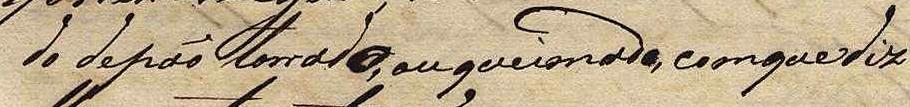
do de paõ torrado, ou queimado, com que diz
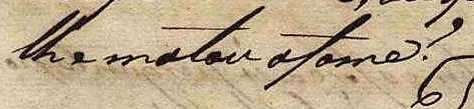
lhe matou a fome?
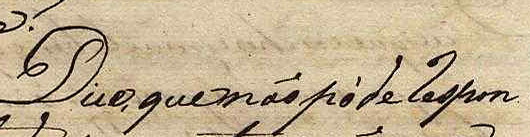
Dice, que naõ póde Respon
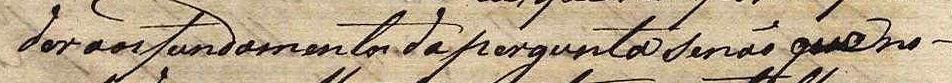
der aos fundamentos da pergunta senaõ que no
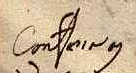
Confesou as
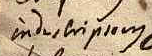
indescripsoens
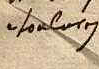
e louCuras
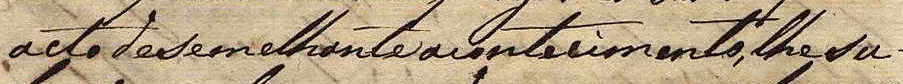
acto de semelhante acontecimento, lhe su
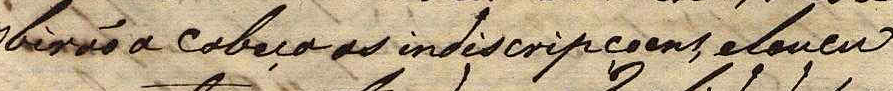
biraõ a cabeça as indiscripçoens, e loucu
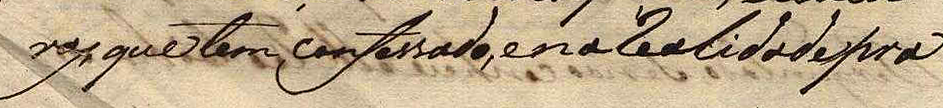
ras, que tem confessado, e na Realidade pra
